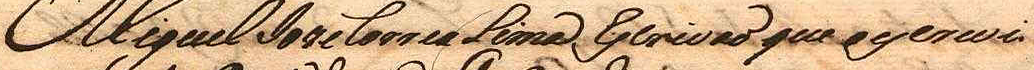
Miguel Ioze Correa Lima Escrivaõ que o escrevi
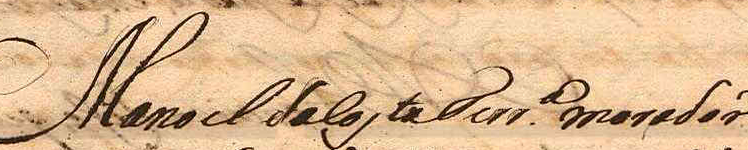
Manoel da Costa Ferr.a morador.
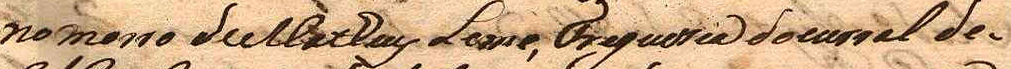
no morro de Matheus Leme, Freguezia do curral de
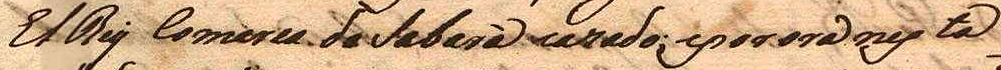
El Rey Comarca do Sabará cazado: e por ora nesta
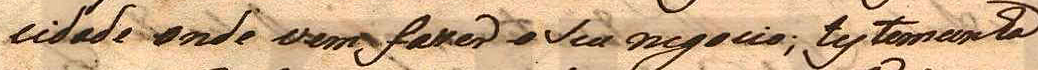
cidade onde vem fazer o seu negocio; testemunha
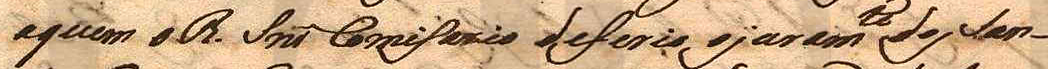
a quem o R. snr̄ Comisario deferio, o juramto dos san
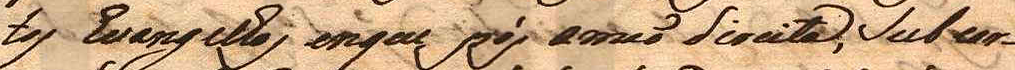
tos Evngelhos em que pós a maõ direita, sub car
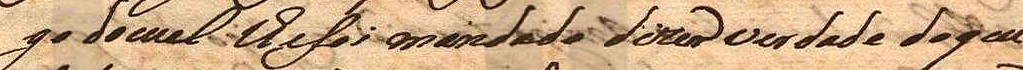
go do cual lhe foi mandado dizer verdade do que
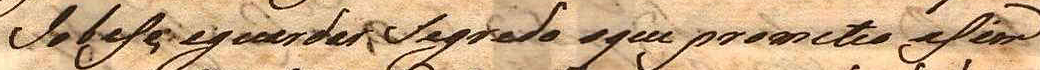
sobese, e guardar segredo o que prometeo asim
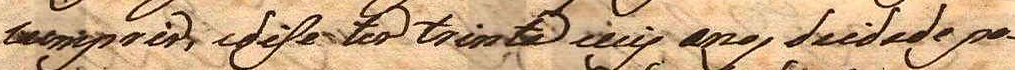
cumprir, e dise ter trinta e ceis anos de idade po
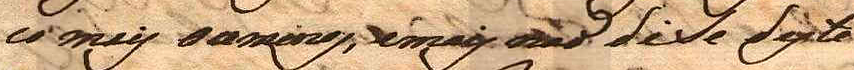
co mais ou menos, e mais naõ dise deste
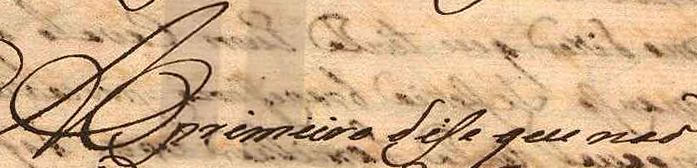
AO primeiro dise que naõ
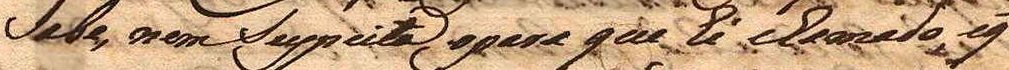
sabe, nem suspeita o para que hé chamado e q̄
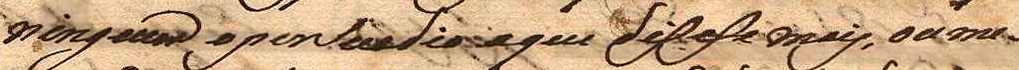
ninguem o persuadio a que disese mais, ou me
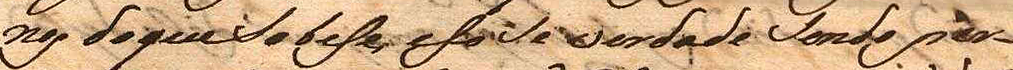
nos do que sobese, e fose verdade sendo per
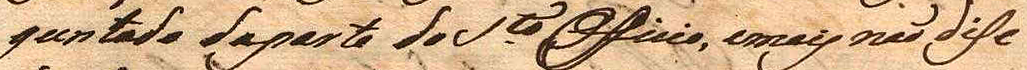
guntado da parte do S.to Officio, e mais naõ dise
